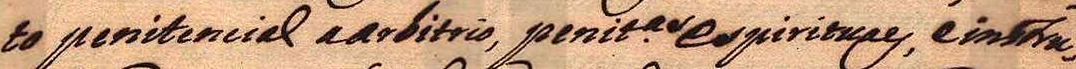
to penitencial a arbitrio, penit.as espirituaes, e instru
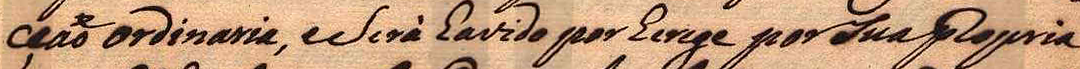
cçaõ ordinaria, e Será havido por herege por sua propria
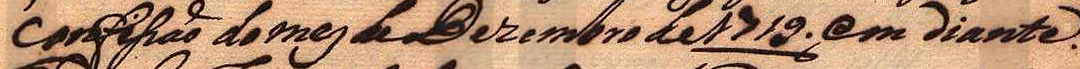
confissaõ do mes de Dezembro de 1719. em diante.
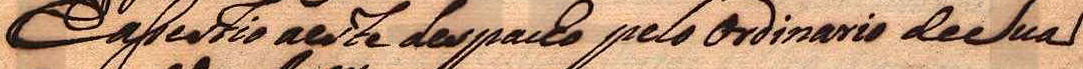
E assestio a este despacho pelo ordinario de Sua
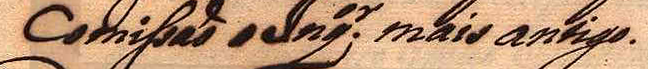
Comissaõ o Inq.or mais antigo.
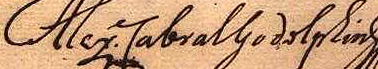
Alex. Cabral Godolphin
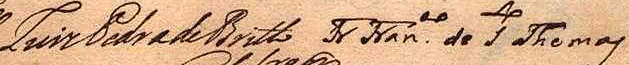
Luiz Pedra de Britto Fr Fran.co de sto thomas
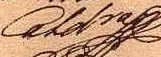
Cald.ra
